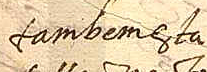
tambem esta
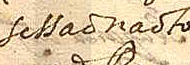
sessaõ naõ to
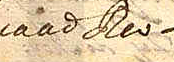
ca ao Reo
